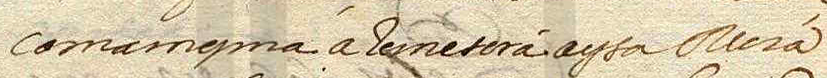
com a mesma a Remeterá a esta Meza
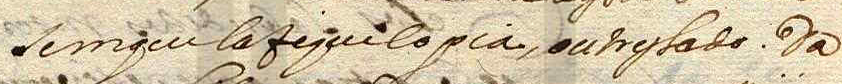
sem que la fique Copia, ou treslado. Da
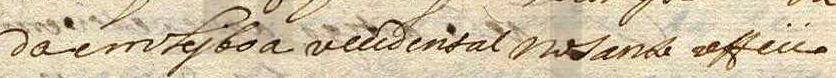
da em Lisboa occidental no santo officio
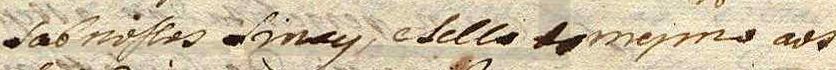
sob nossos sinaes, e sello do mesmo aos
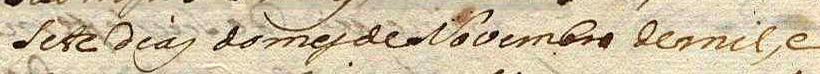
sete dias do mes de Novembro de mil, e
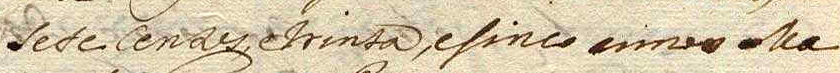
setecentos e trinta, e sinco annos Ma
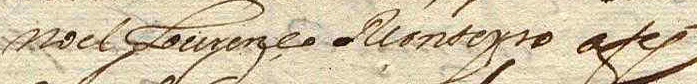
noel Lourenço Monteyro a fes
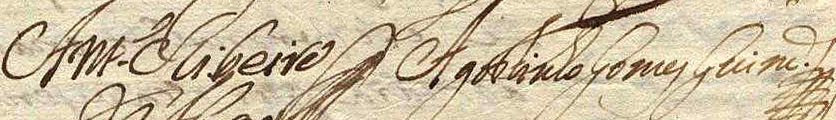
Anto Ribeiro _ Agostinho Gomes Guim.s
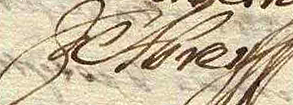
de Abreu
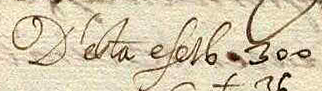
D'esta e sello 300
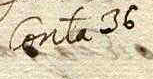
Conta 36
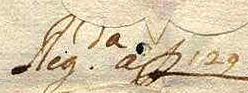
Reg.da a f. 129
